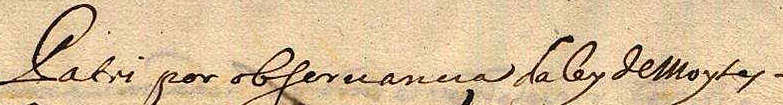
Patri por obseruancia da ley de Moyses
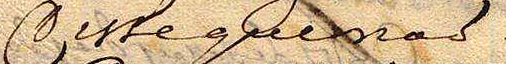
Disse que naõ
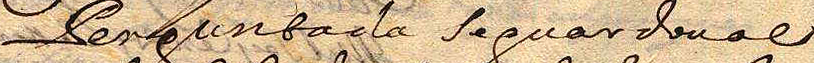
Perguntada se guardou al
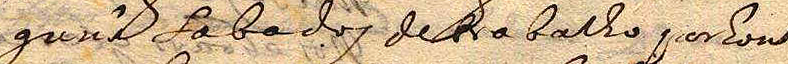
guns sabados de trabalho por hon
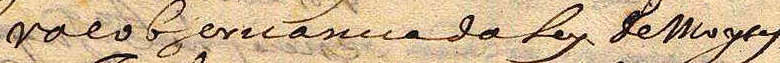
ra e obseruancia da Ley de Moyses
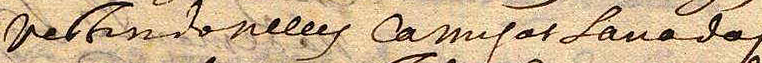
vestindo nelles camisas Lauadas
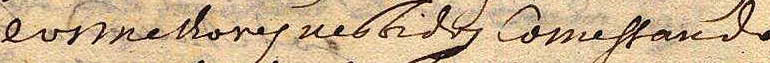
e os melhores uestidos Comessando
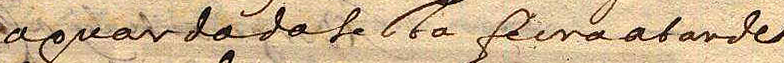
a guarda da sesta feira a tarde
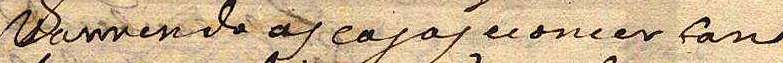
varrendo as casas e concertan
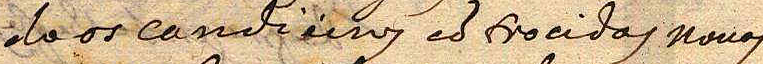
do os candieiros cō trocidas nouas
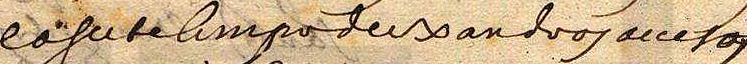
e aseite limpo deixando os accesos
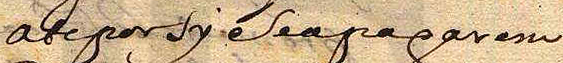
ate por sy Se apagarem
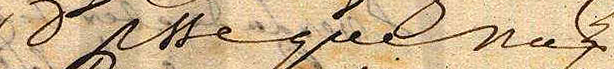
Disse que naõ
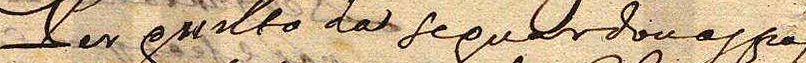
Perguntada se guardou as pas
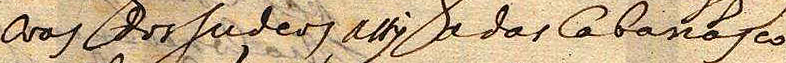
coas dos Judeos assy a das Cabanas co
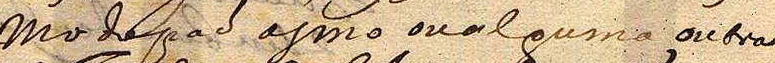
mo do paõ asmo ou alguma outra
